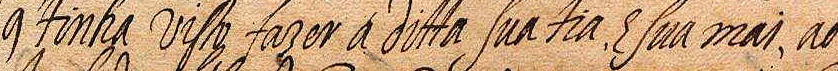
q̅ tinha visto fazer a ditta sua tia, E sua mai, ao
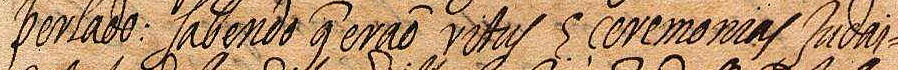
perlado: sabendo q̅ eraõ ritus E çeremonias Judai
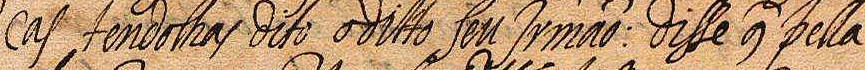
cas tendolhas dito o ditto seu Jrmaõ: disse q̅ pella
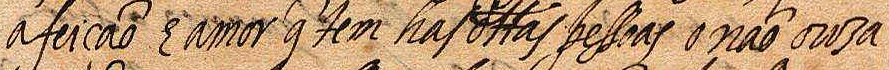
afeiçaõ E amor q̅ tem has d̅ttas pessoas o naõ ouza
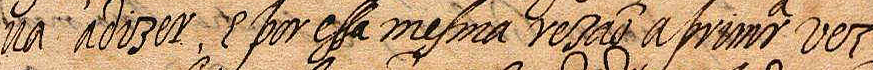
ua a dizer, E por essa mesma rezaõ a primra vez
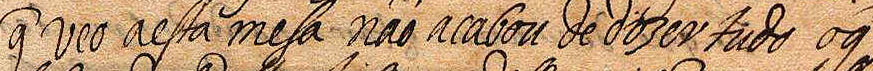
q̅ veo a esta mesa não acabou de dizer tudo o q̅
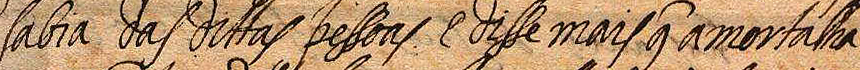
sabia das dittas pessoas E disse mais q̅ a mortalha
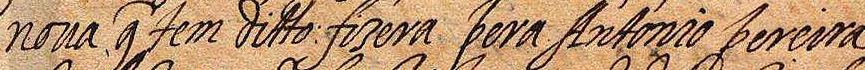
noua, q̅ tem ditto: fizera pera Antonio pereira
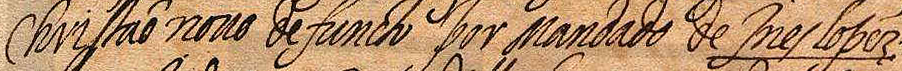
Christaõ nouo defuncto por Mandado de Jnes Lopez̄
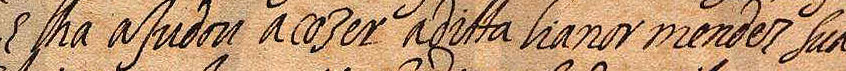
E lha aJudou a cozer a ditta lianor mendez sua
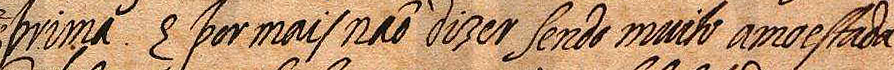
prima. E por mais naõ dizer sendo muito amoestada
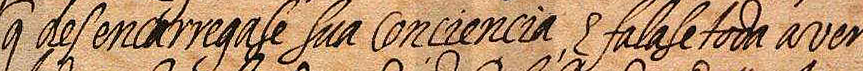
q̅ desencarregase sua conçiencia, E falase toda a ver
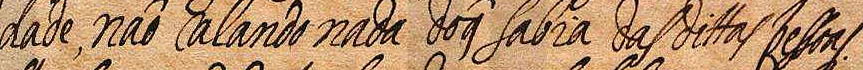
dade, naõ calando nada do q̅ sabia das dittas pessoas
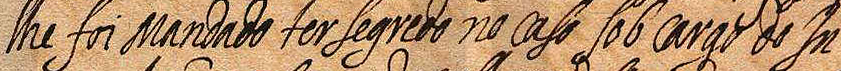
lhe foi Mandado ter segredo no caso sob cargo do Ju
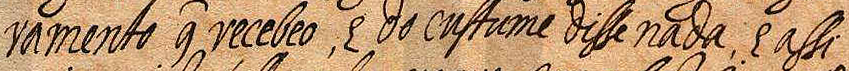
ramento q̅ reçebeo, E do custume disse nada, E assi
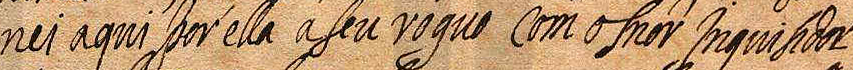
nei aqui por ella a seu roguo com o sno̅r Jnquisidor
